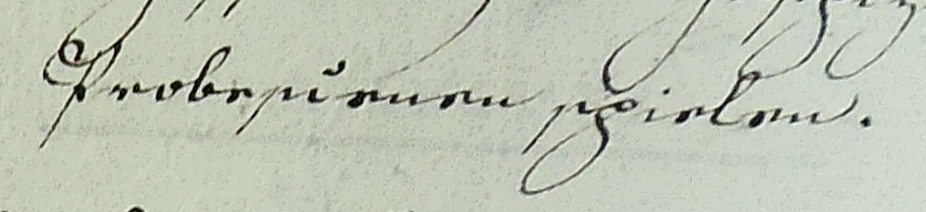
Probescenen spielen.
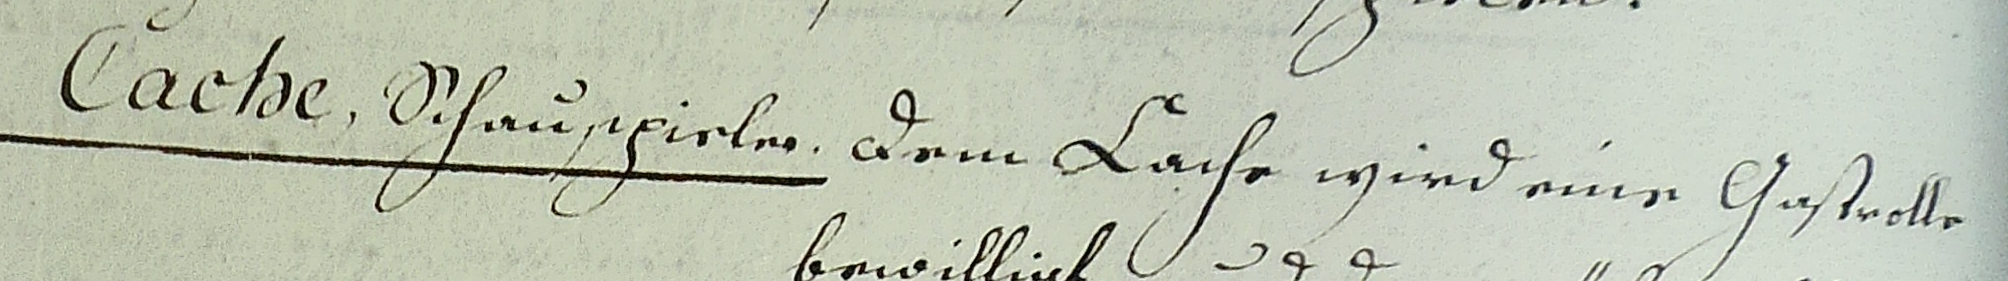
Cache, Schauspieler. Dem Cache wird eine Gastrolle
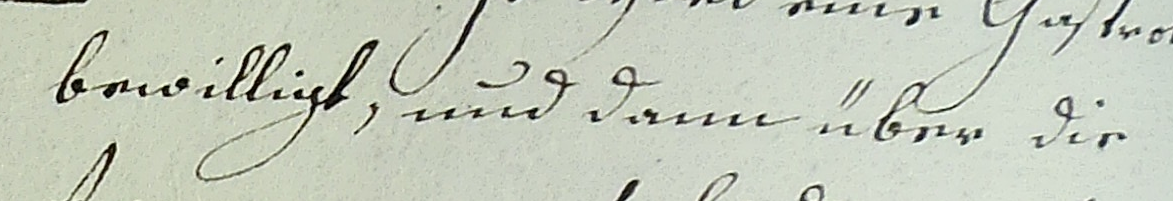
bewilligt, und dann über die
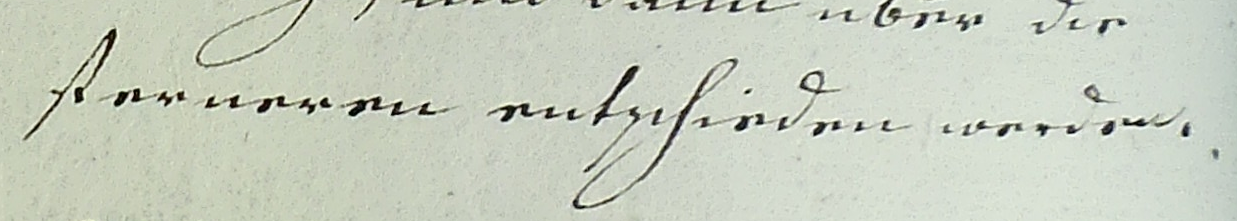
ferneren entschieden werden.
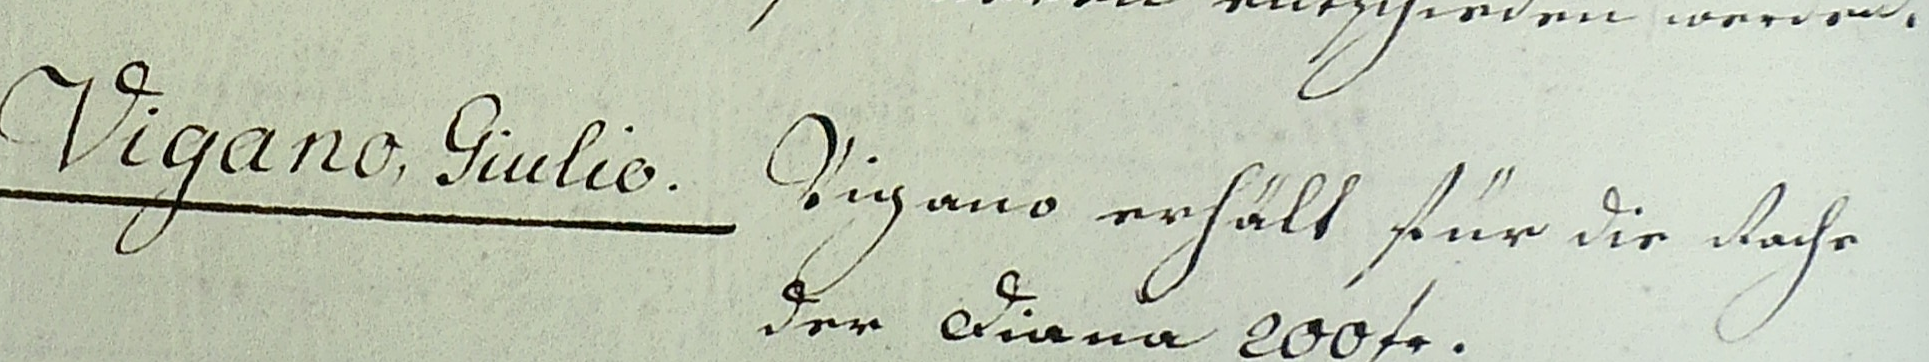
Vigano, Giulio. Vigano erhält für die Rache
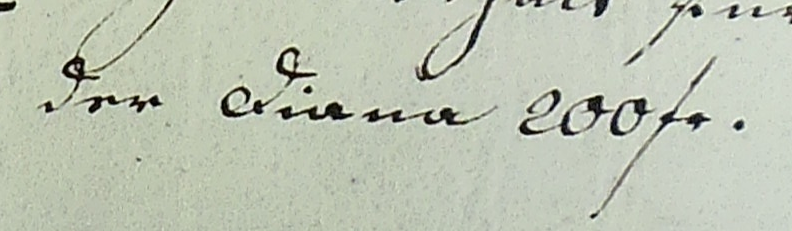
der Diana 200 fr.
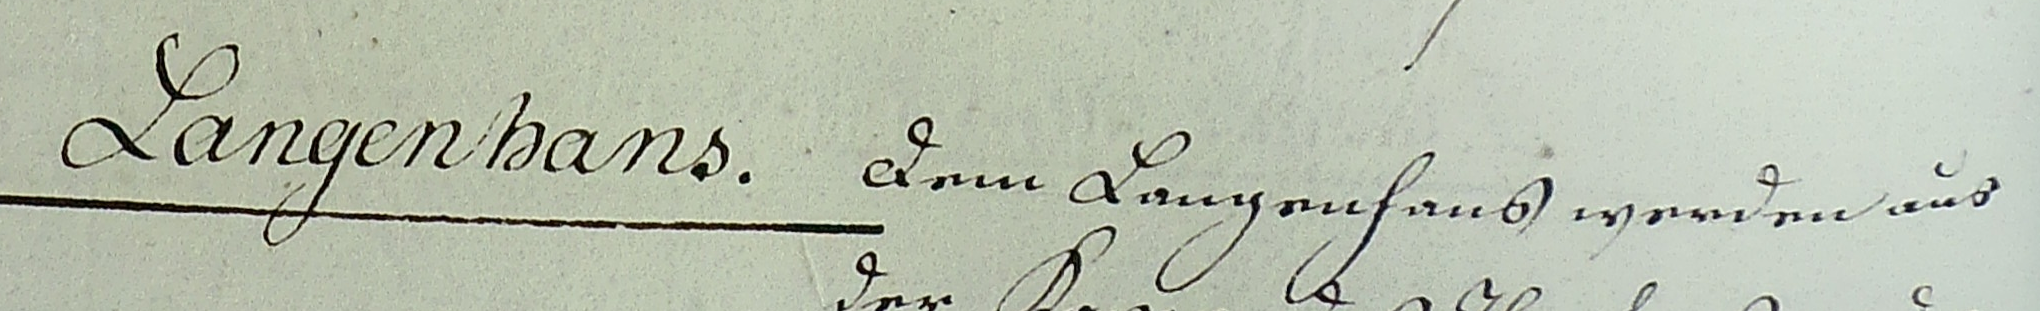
Langenhans. Dem Langenhans werden aus
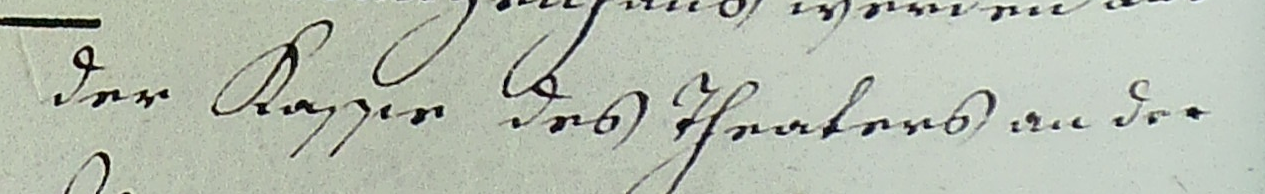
der Kasse des Theaters an der
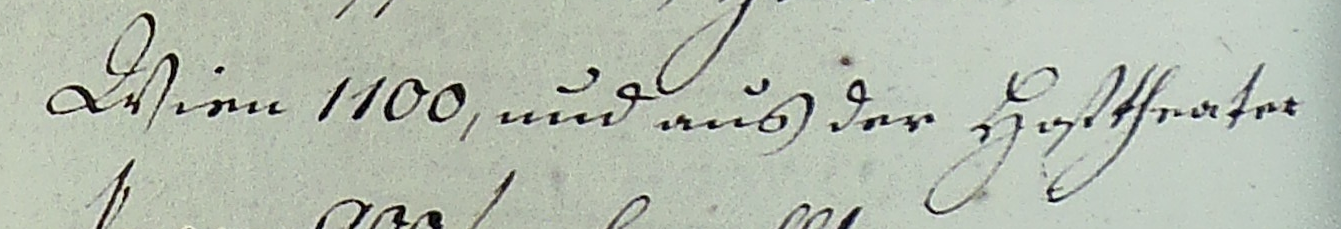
Wien 1100, und aus der Hoftheater
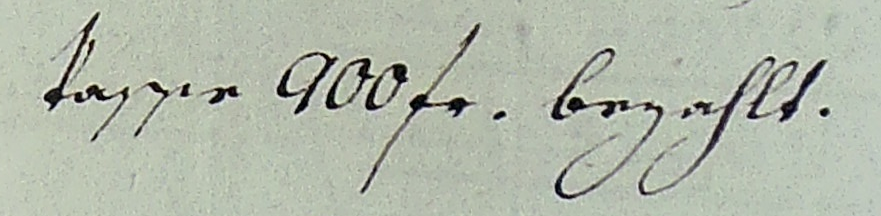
Kasse 900fr. bezahlt.
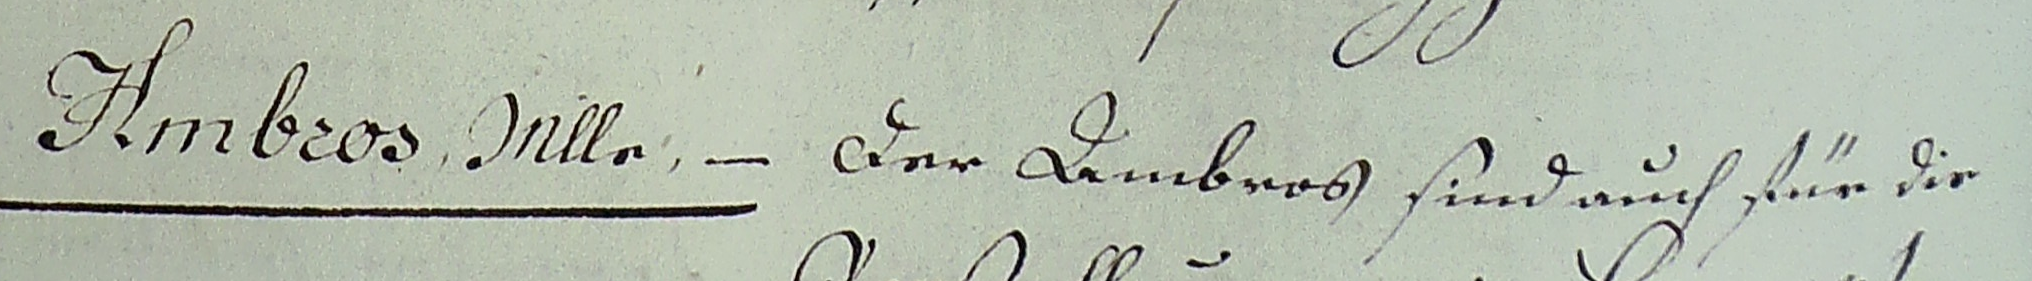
Ambros, Mlle. _ Der Ambros sind auch für die
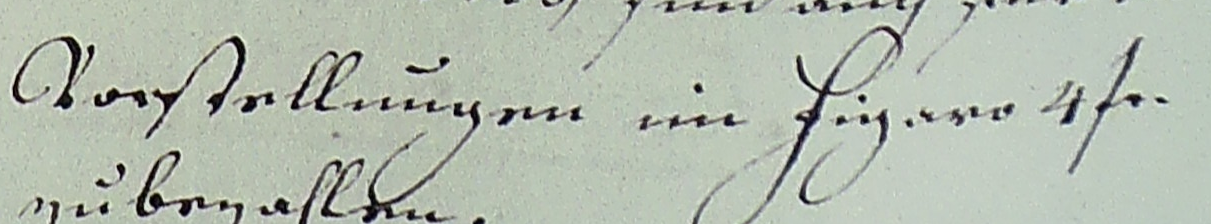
Vorstellungen im Figaro 4fr.
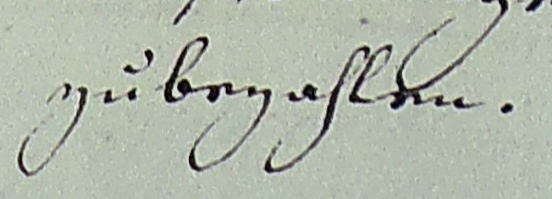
zu bezahlen.
